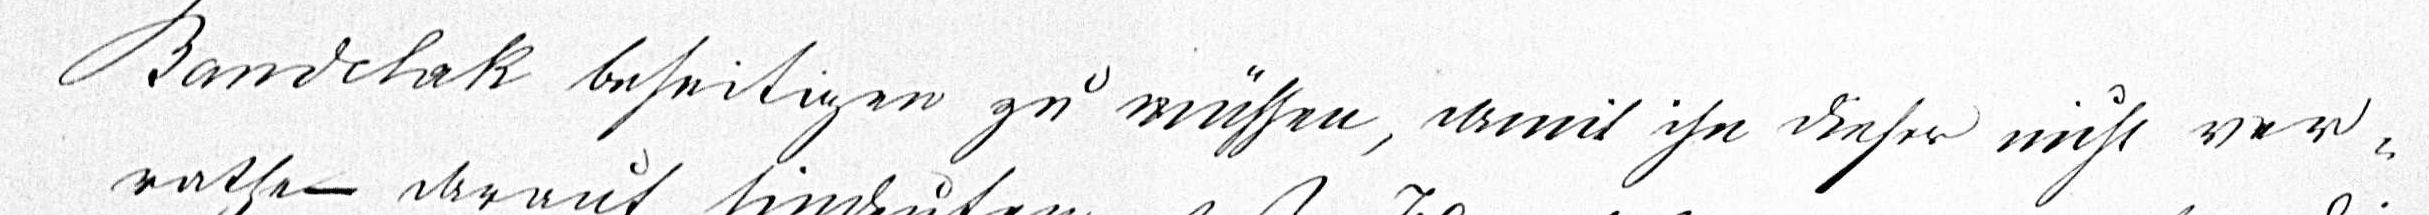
Bandelak beseitigen zu müssen, damit ihn dieser nicht ver¬
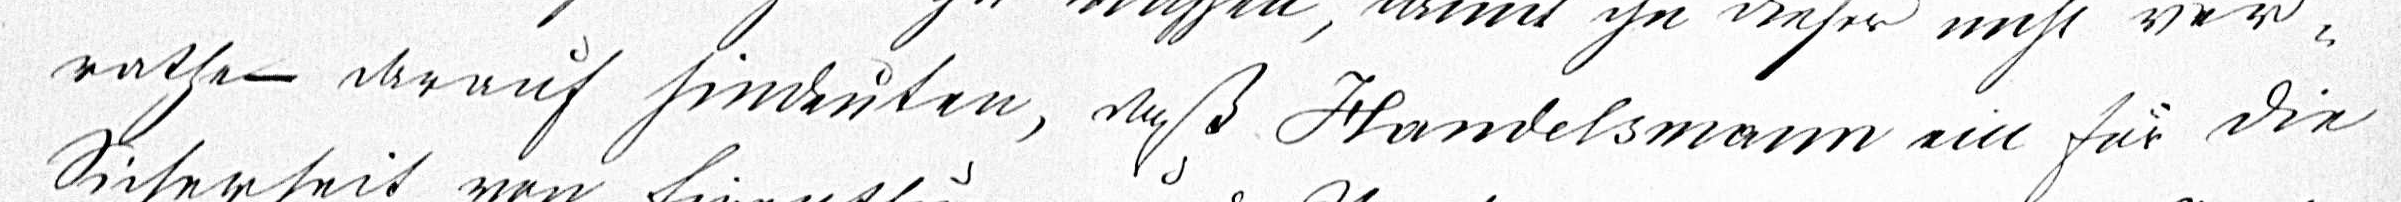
rathe – darauf hindeuten, daß Handelsmann ein für die
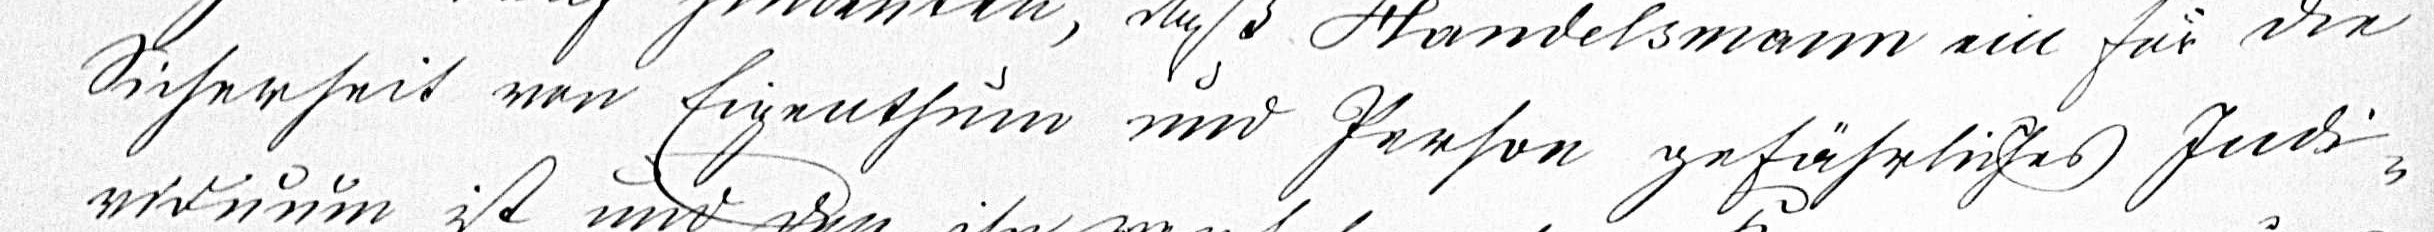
Sicherheit von Eigenthum und Person gefährliches Indi¬
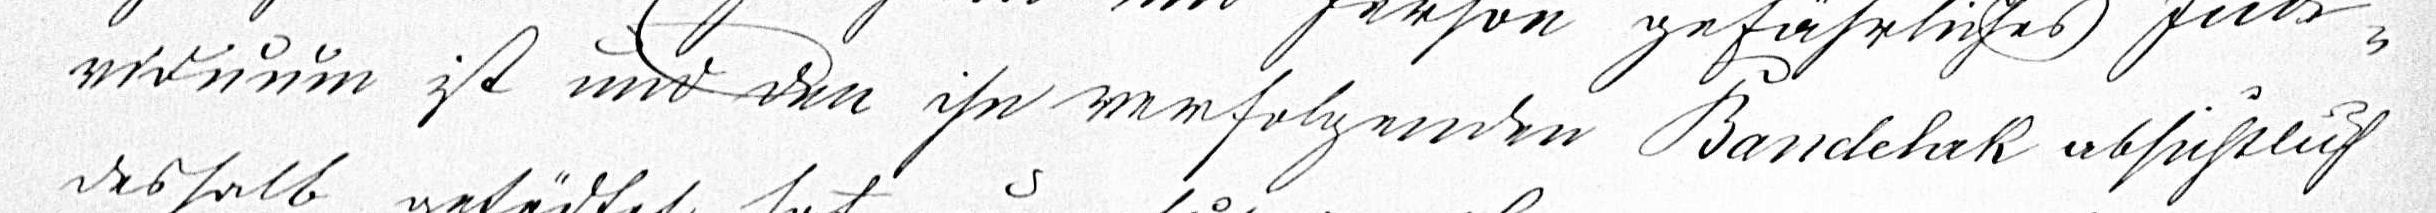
viduum ist und den ihn verfolgenden Bandelak absichtlich
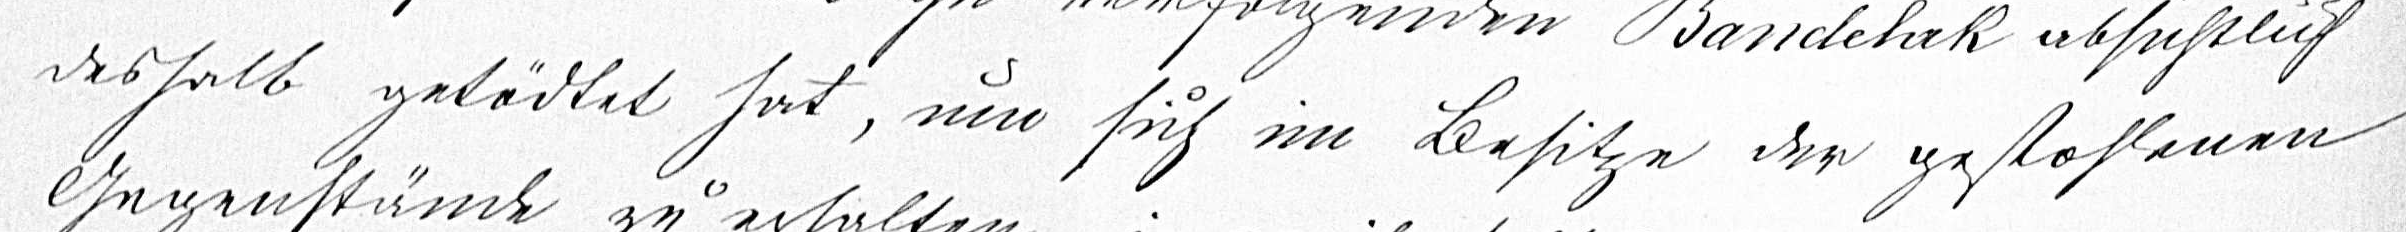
deshalb getödtet hat, um sich im Besitze der gestohlenen
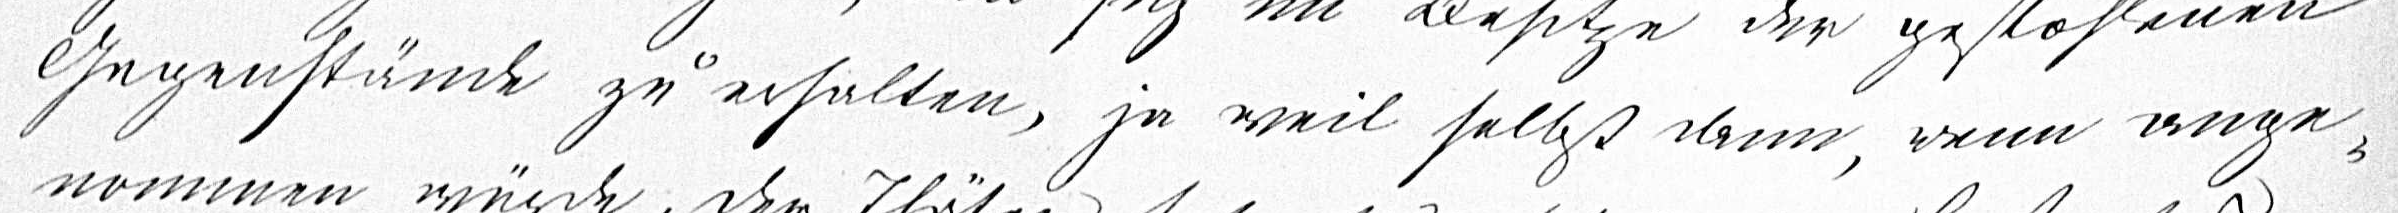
Gegenstände zu erhalten, je weil selbst denn, wenn ange¬
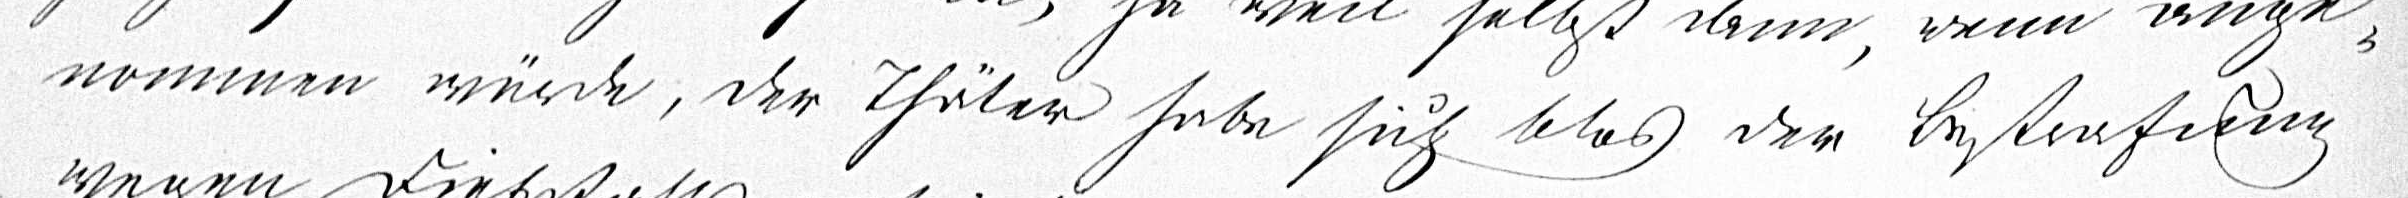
nommen würde, der Thäter habe sich blos der Bestrafung
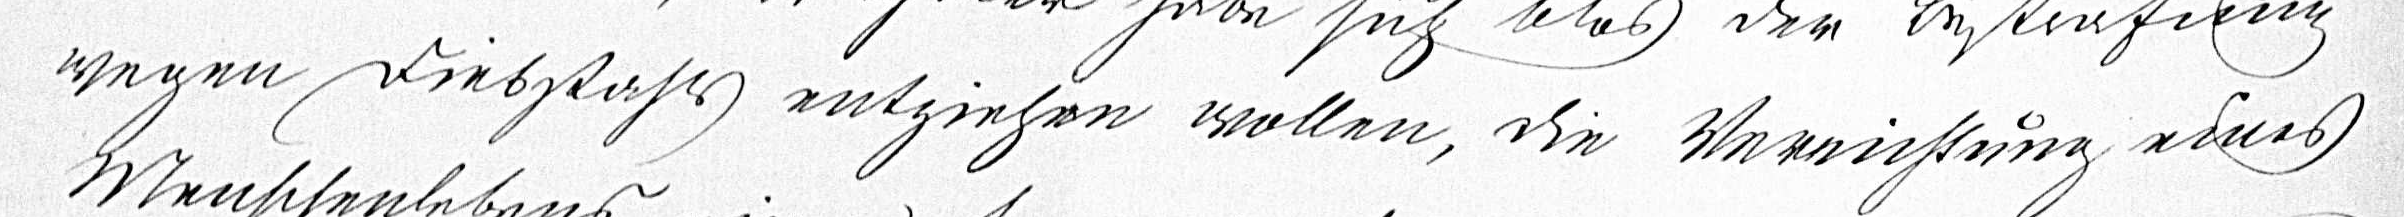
wegen Diebstahls entziehen wollen, die Vernichtung eines
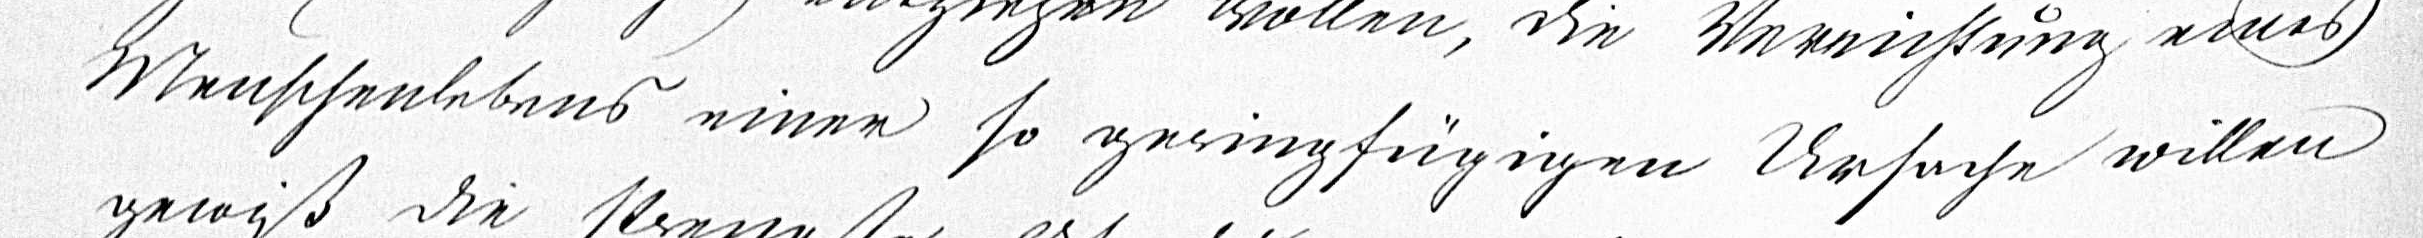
Menschenlebens einer so geringfügigen Ursache willen
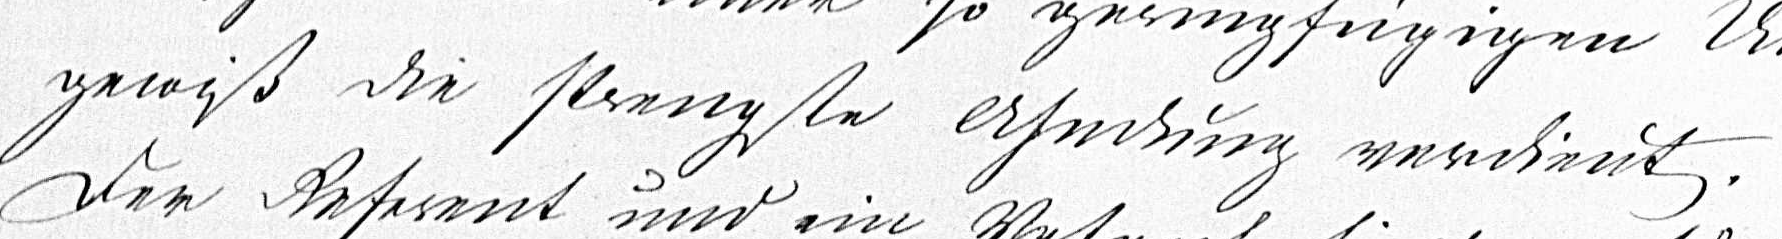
gewiß die strengste Ahndung verdient.
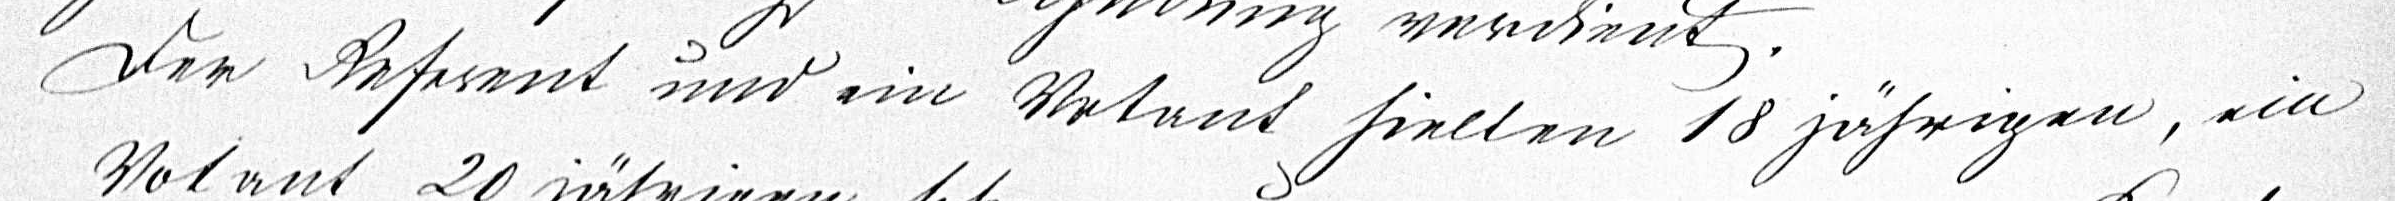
Der Referent und ein Votant hielten 18jährigen, ein
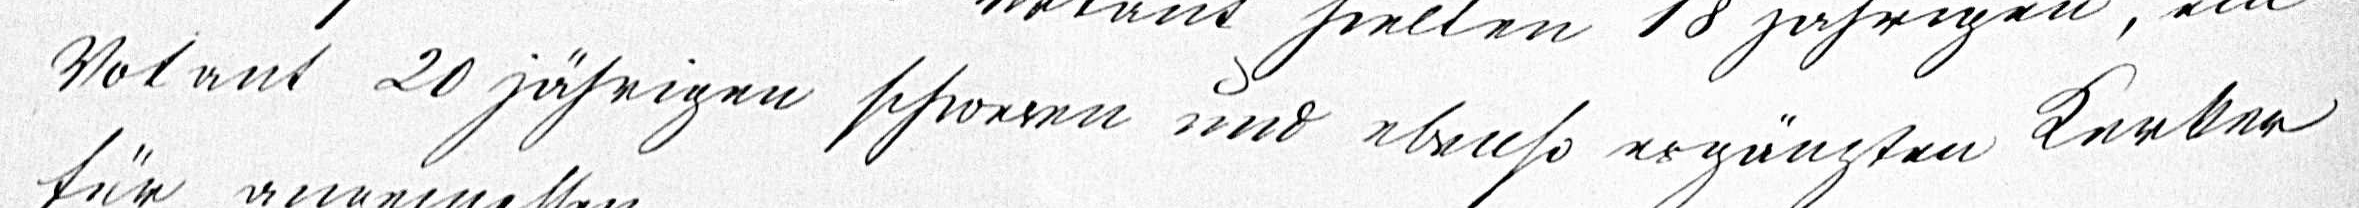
Votant 20 jährigen schweren und ebenso ergänzten Kerker
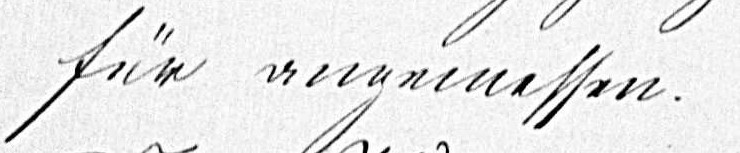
für angemessen.
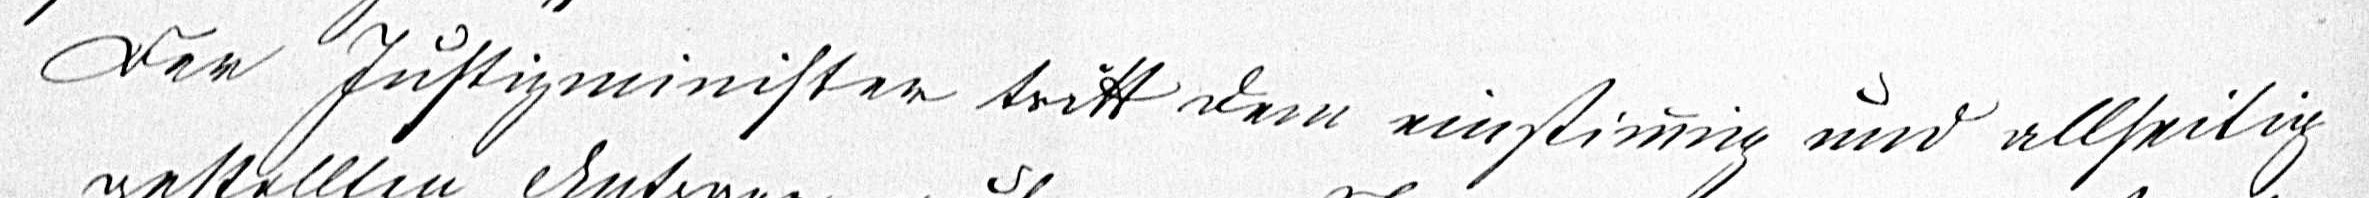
Der Justizminister tritt dem einstimmig und allseitig
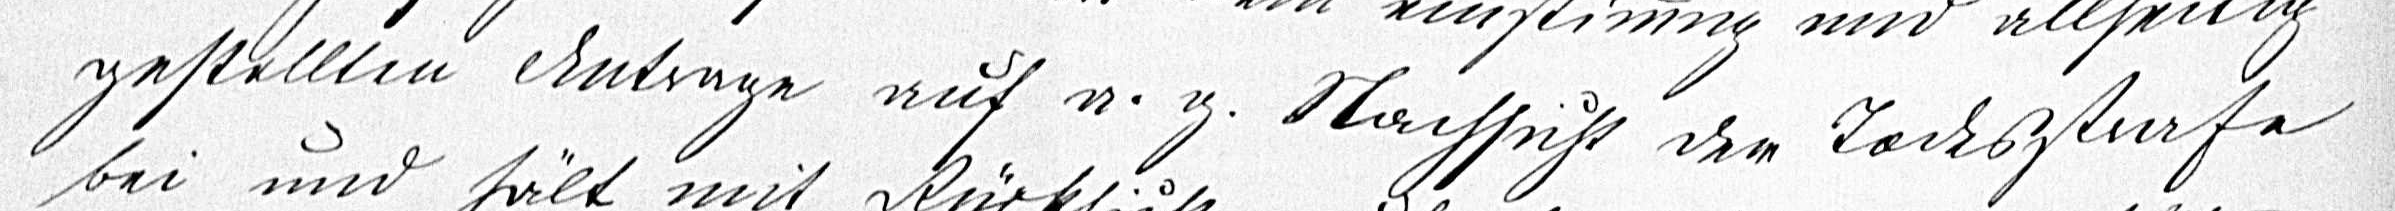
gestellten Antrage auf a.g. Nachsicht der Todesstrafe
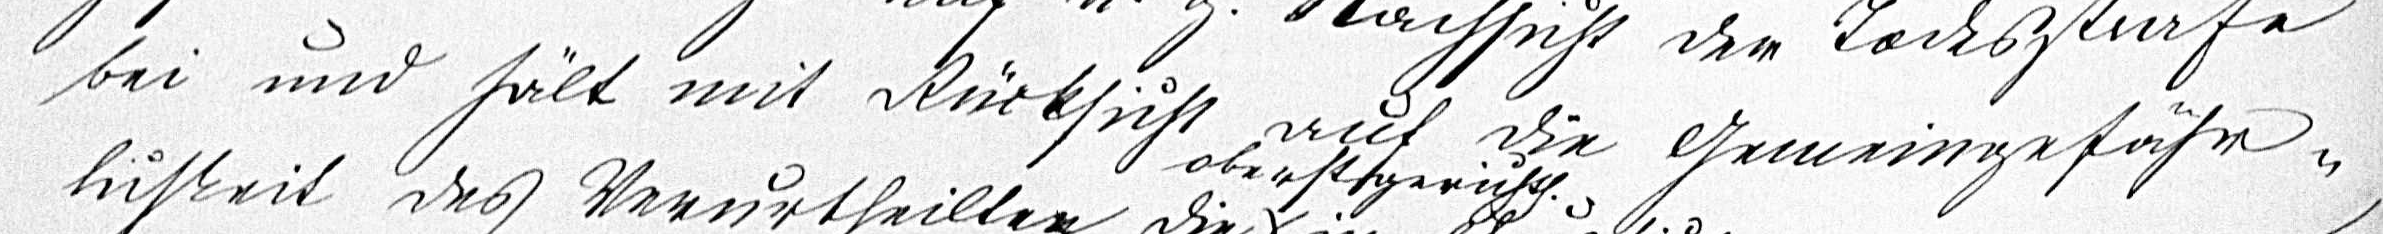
bei und hält mit Rücksicht auf die Gemeingefähr¬
